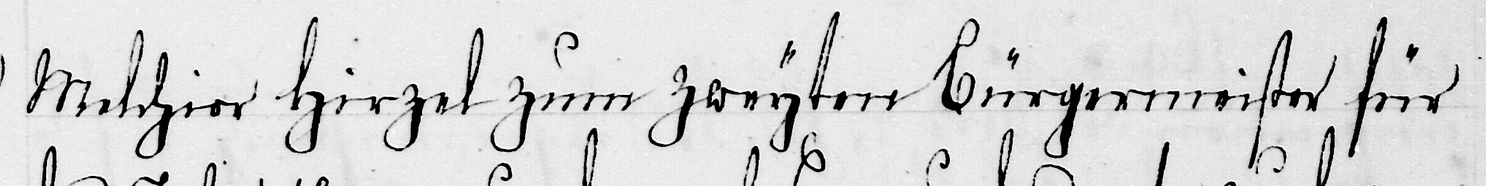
Melchior Hirzel zum zweyten Bürgermeister für
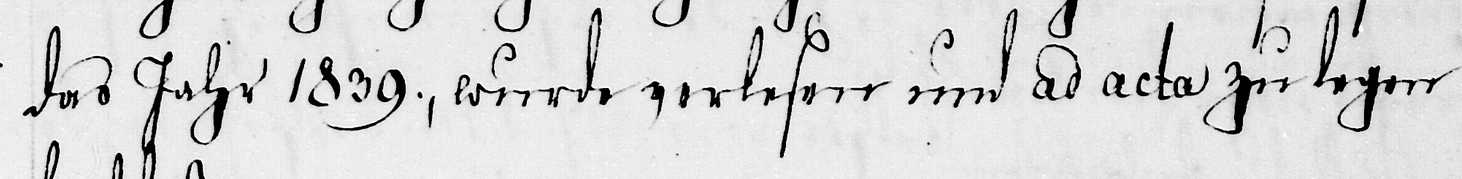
das Jahr 1839., wurde verlesen und ad acta zu legen
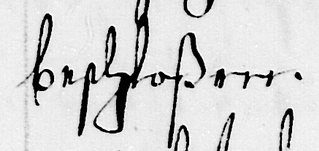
beschloßen.
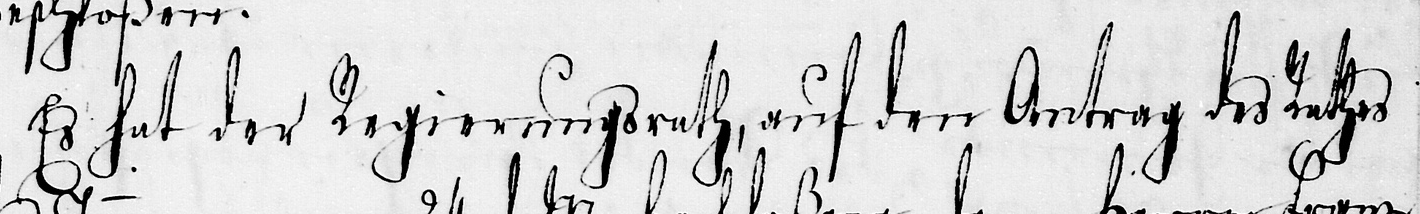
Es hat der Regierungsrath, auf den Antrag des Rath¬
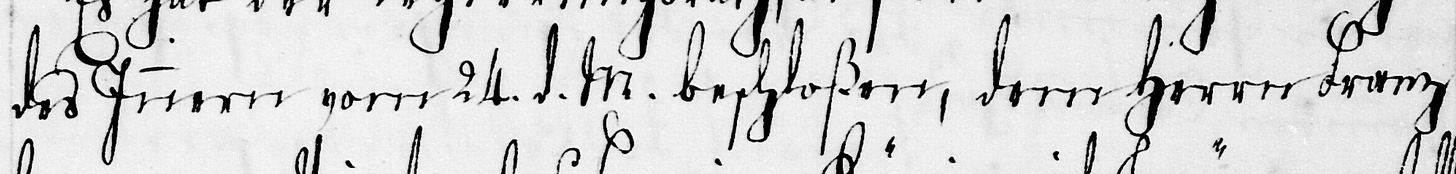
des Innern vom 24. d. M. beschloßen, dem Herrn Franz
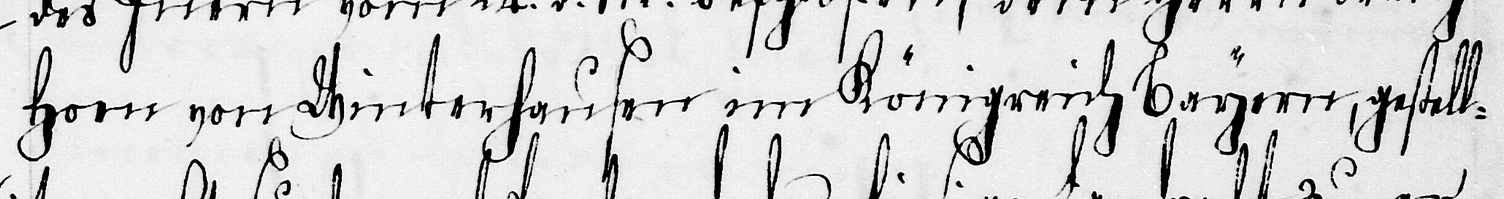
Hoen von Winterhausen im Königreich Bayern, gestel¬
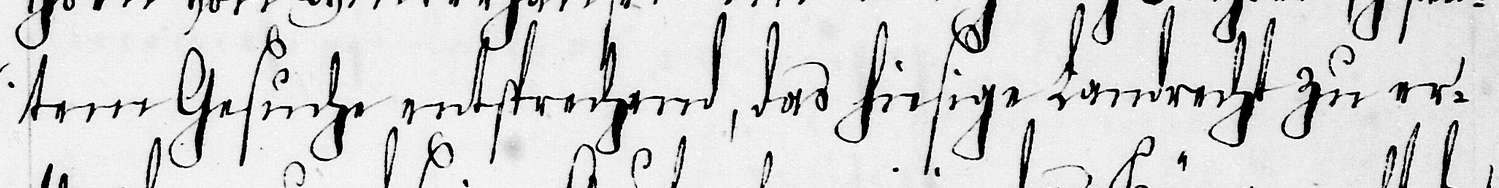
ltem Gesuche entsprechend, das hiesige Landrecht zu er¬
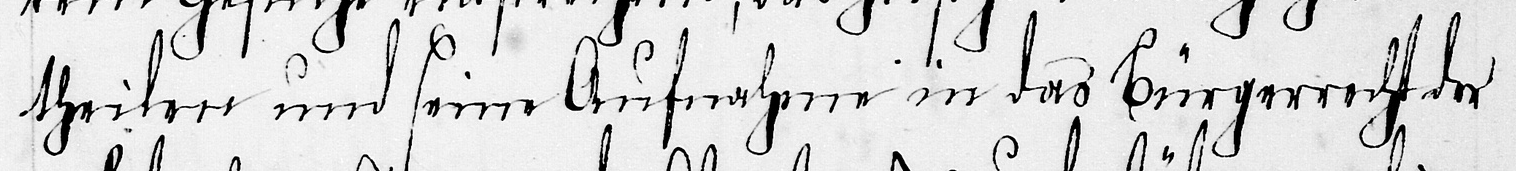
theilen und seine Aufnahme in das Bürgerrecht der
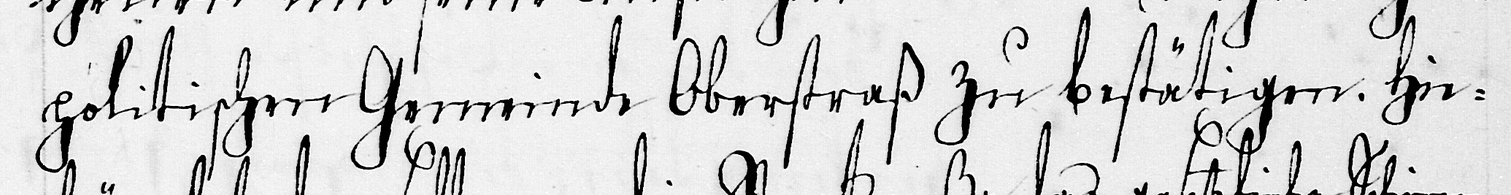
politischen Gemeinde Oberstraß zu bestätigen. Hie¬
